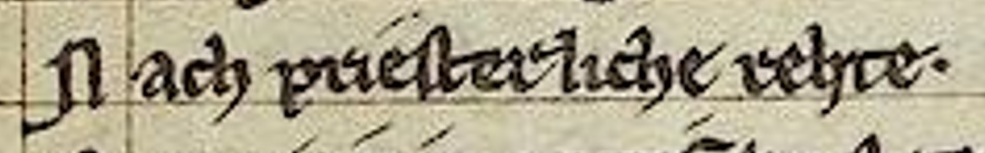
Nach prieſterliche rehte.
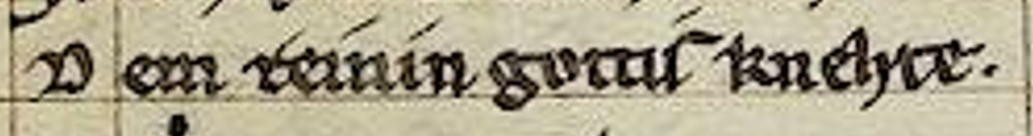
Dem reinin gottiſ knehte.
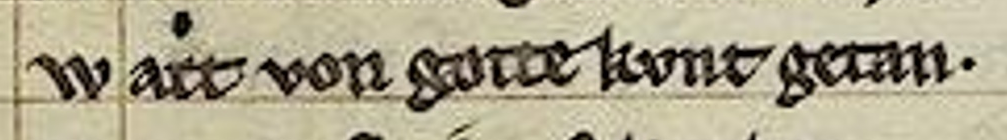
Wart von gotte kvnt getan.
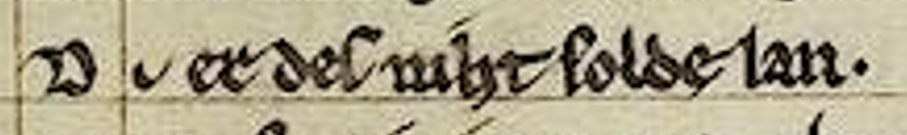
D(az) er deſ niht ſolde lan.
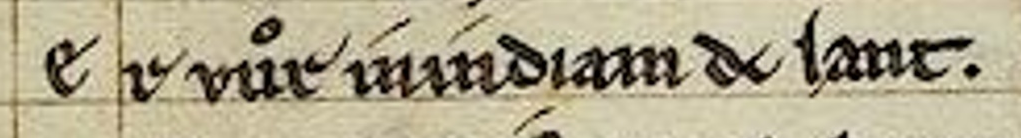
Er vu°or inindiam d(az) lant.
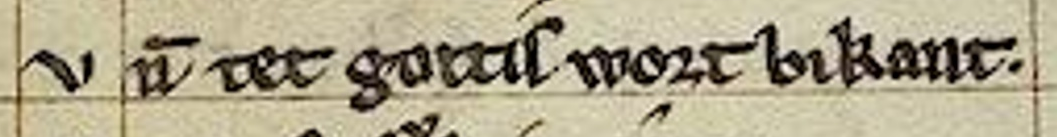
Vn(d) tet gottiſ wort bikant.
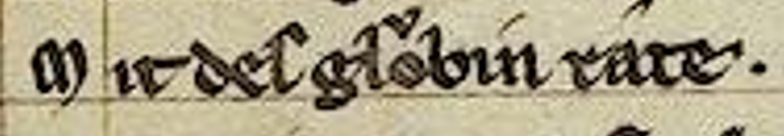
Mit deſ glo°vbin rate.
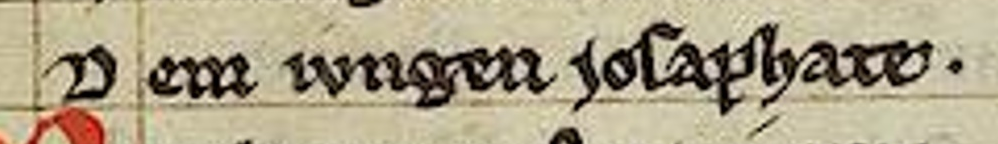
Dem ivngen joſaphate.
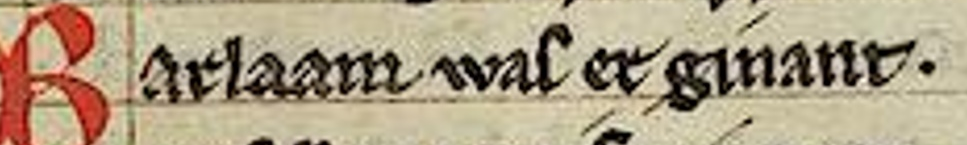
**Barlaam waſ er ginant.
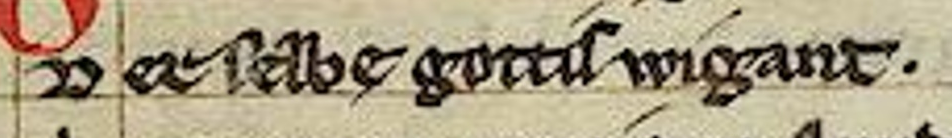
Der ſelbe gottiſ wigant.
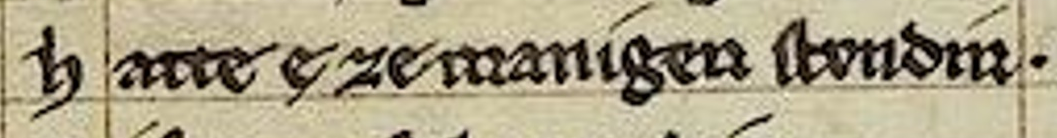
Hatte e ze manigen ſtvndin.
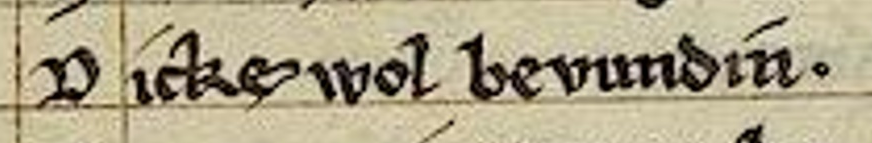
Dicke wol bevundin.
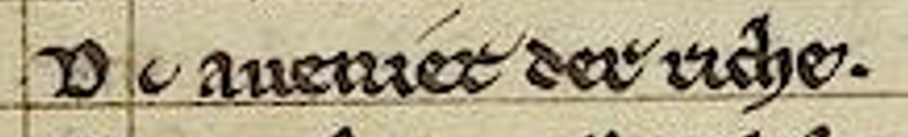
D(az) auenier der riche.
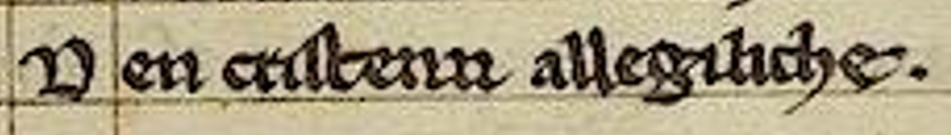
Den criſtenn allegiliche.
